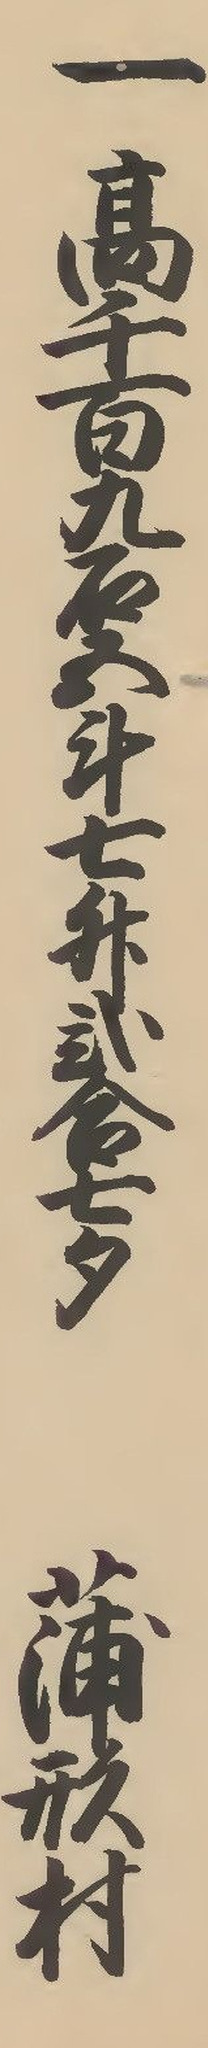一高千百九石五斗七升弐合七勺蒲形村
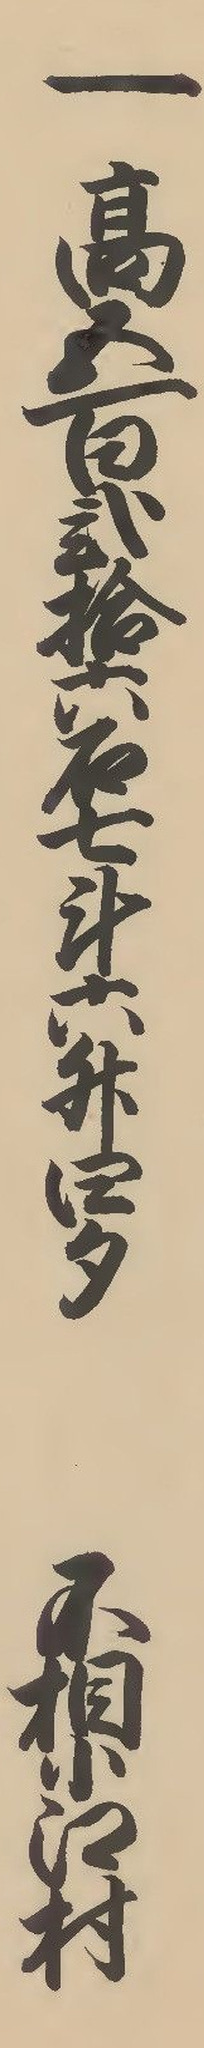一高五百弐拾六石七斗六升四勺不相小江村
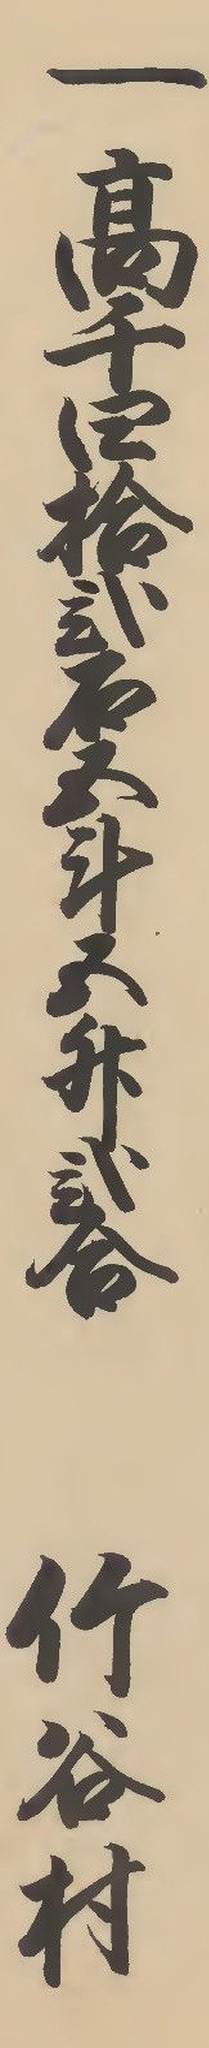一高千四拾弐石五斗五升弐合竹谷村
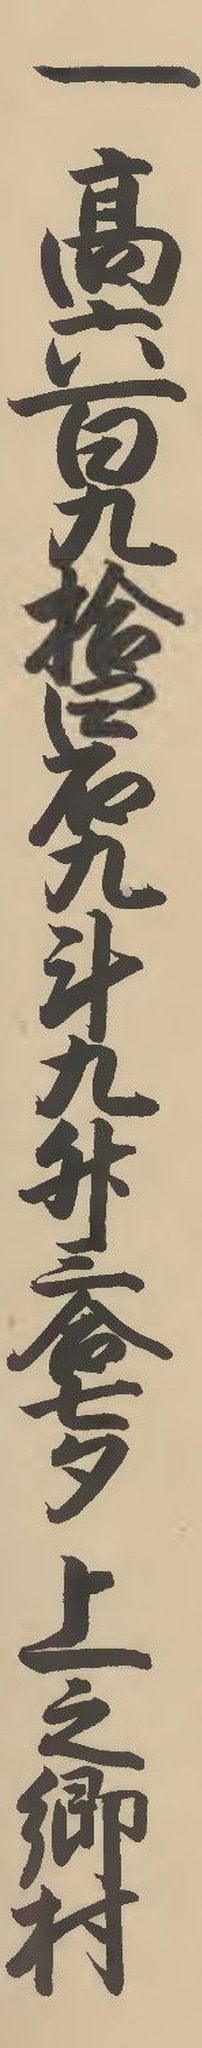一高六百九拾四石九斗九升三合七勺上之郷村
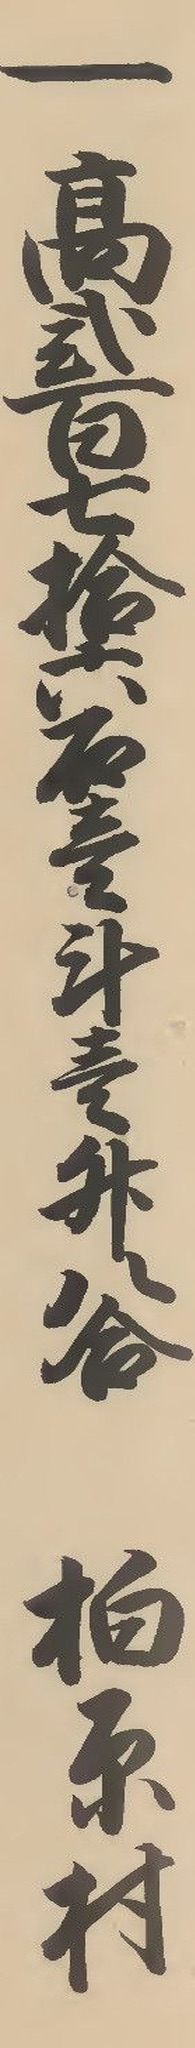一高弐百七拾六石壱斗壱升八合柏原村
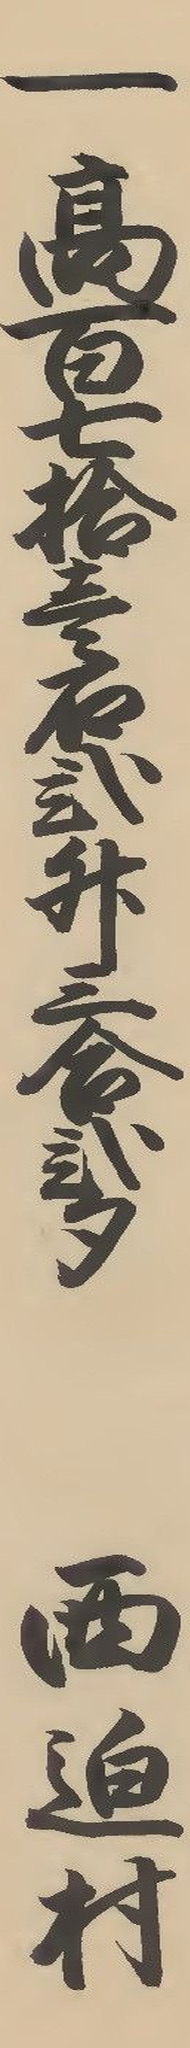一高百七拾壱石弐升三合弐勺西迫村
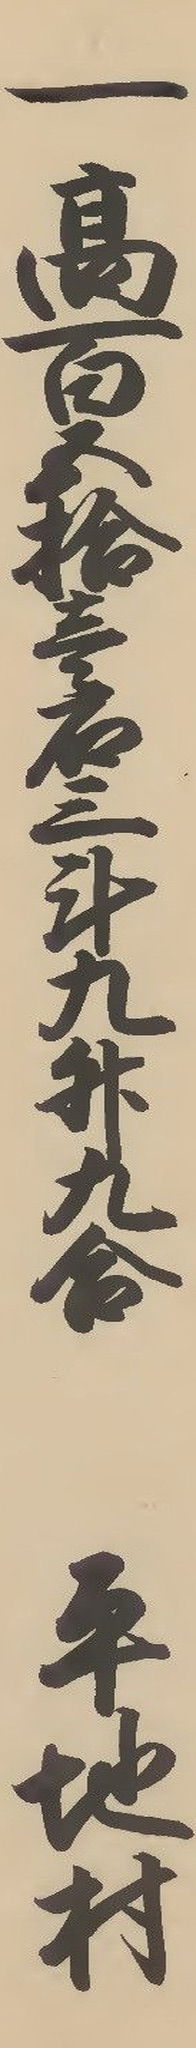一高百五拾壱石三斗九升九合平地村
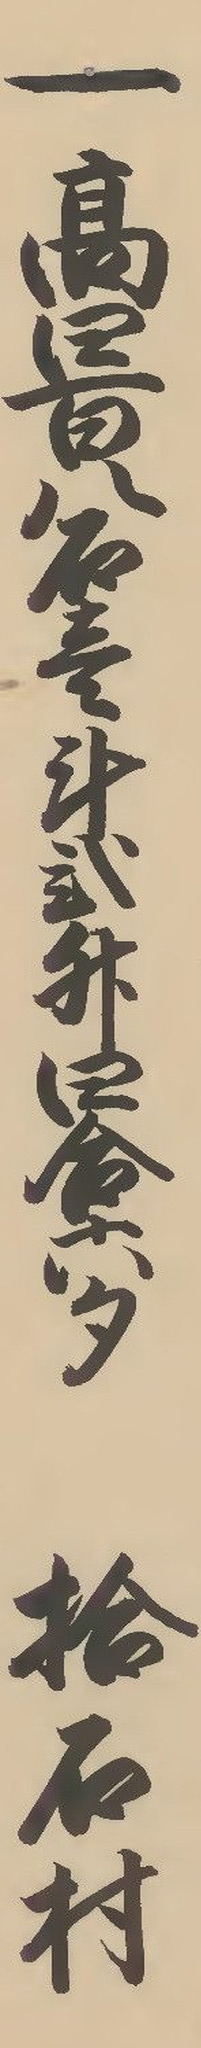一高四百八石壱斗弐升四合六勺拾石村

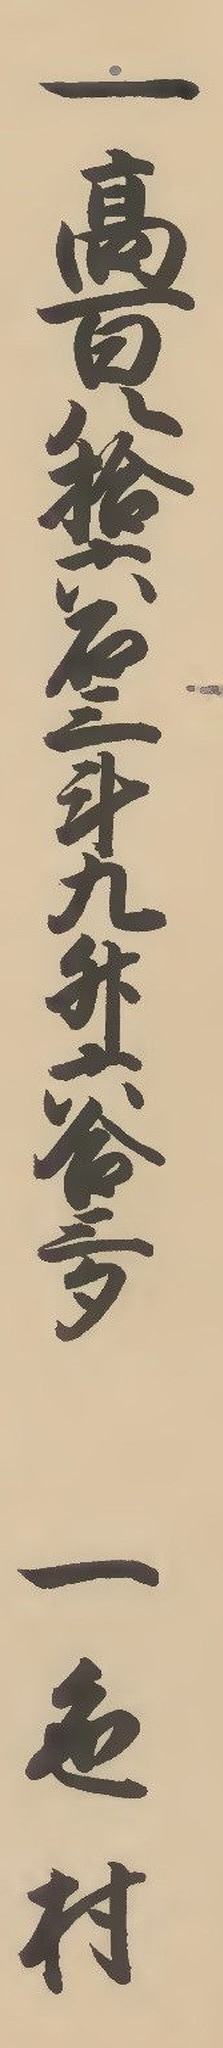一高百八拾六石三斗九升六合三勺一色村
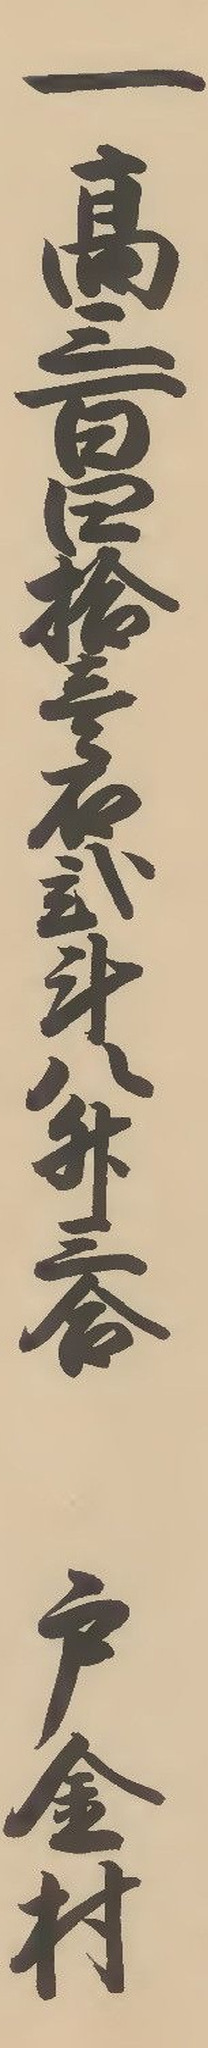一高三百四拾壱石弐斗八升三合戸金村
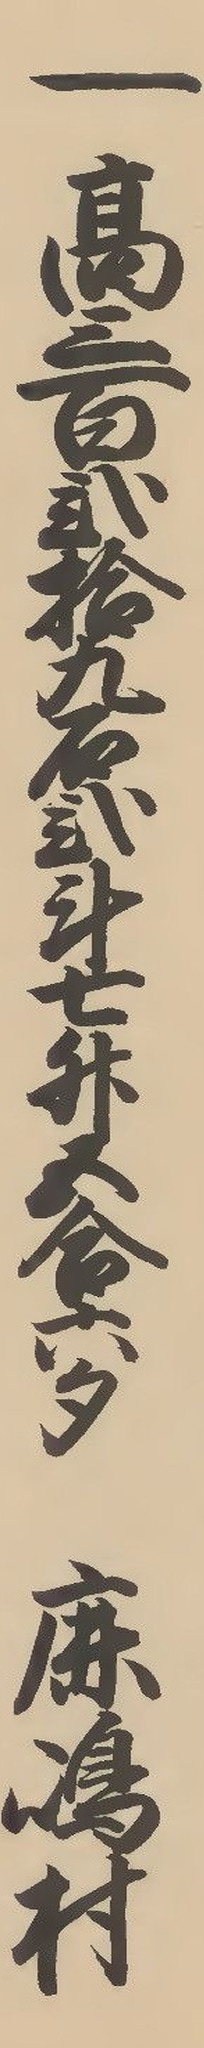一高三百弐拾九石弐斗七升五合六勺鹿島村
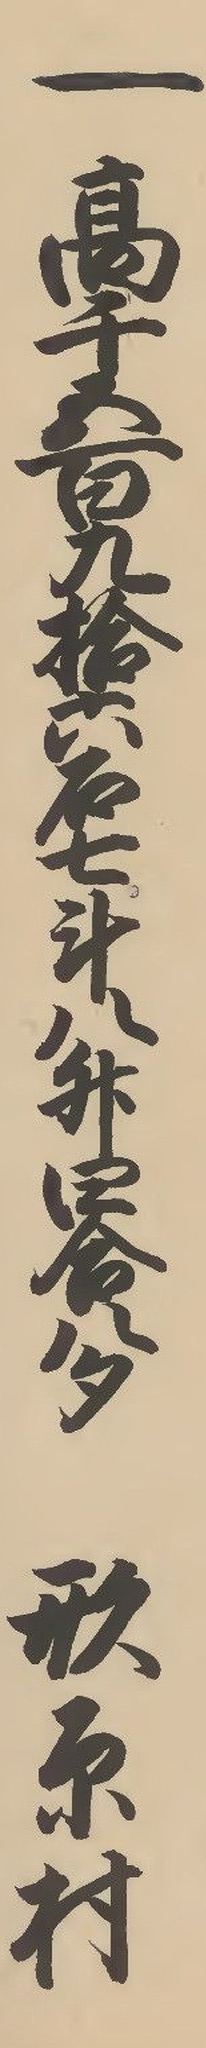一高千五百九拾六石七斗八升四合八勺形原村
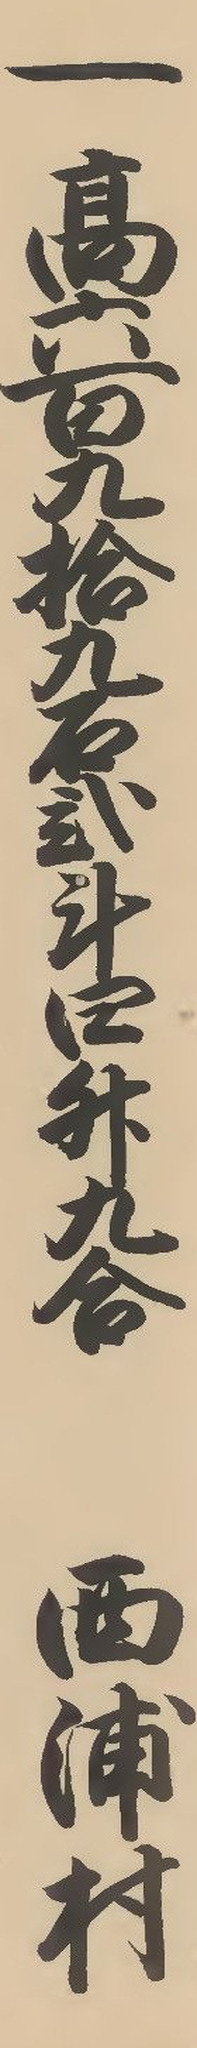一高六百九拾九石弐斗四升九合西浦村
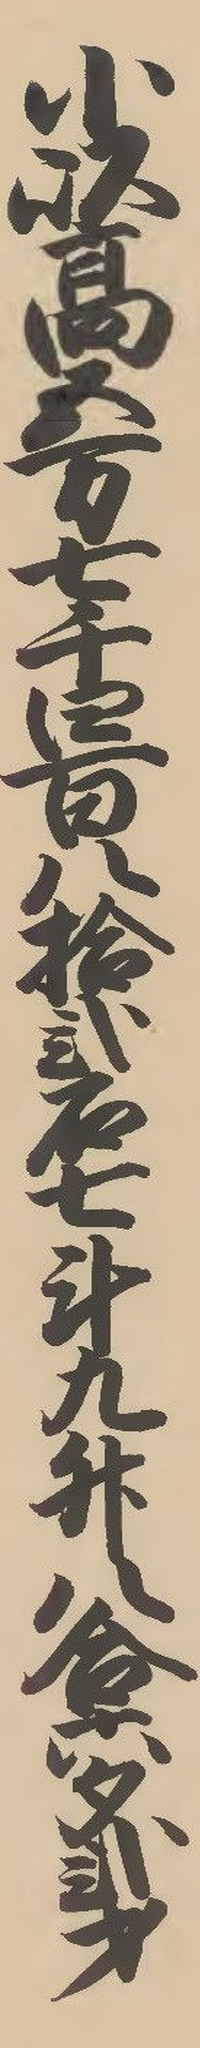小以高五万七千四百八拾弐石七斗九升八合六勺弐才

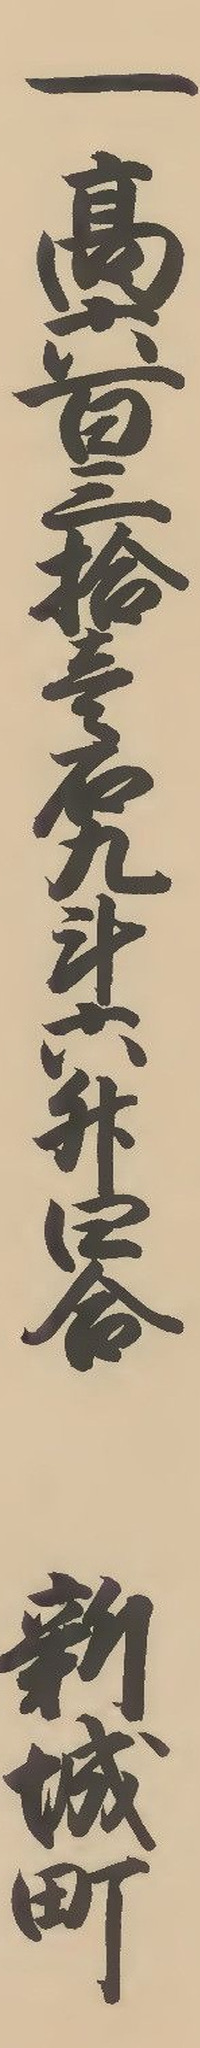一高六百三拾壱石九斗六升四合新城町
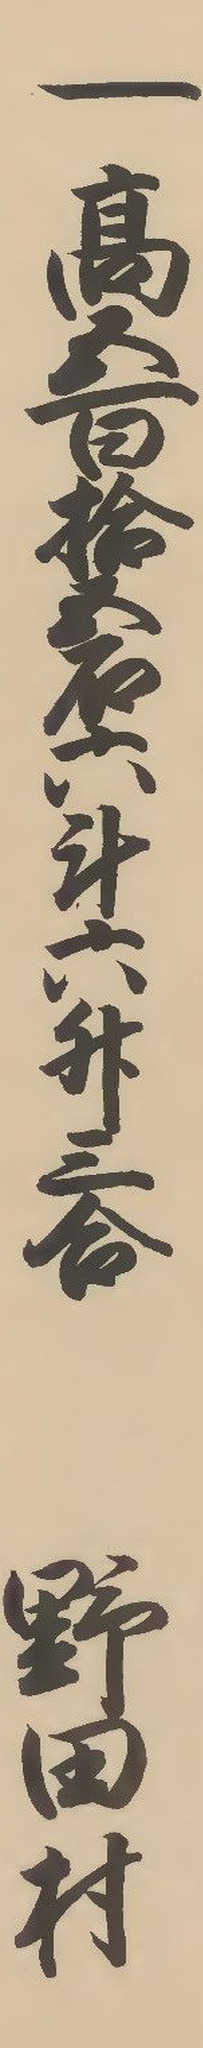一高五百拾五石六斗六升三合野田村
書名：三河国郷帳
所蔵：国立公文書館 National Archives of Japan
